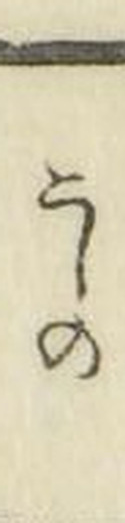こしの
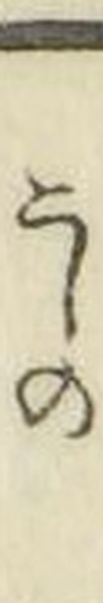こしの
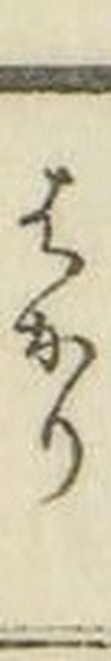はかり

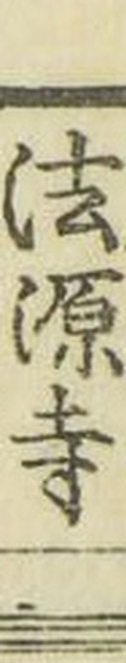法源寺
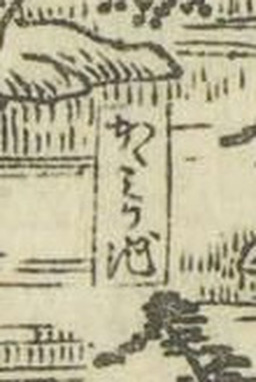かゝみか池
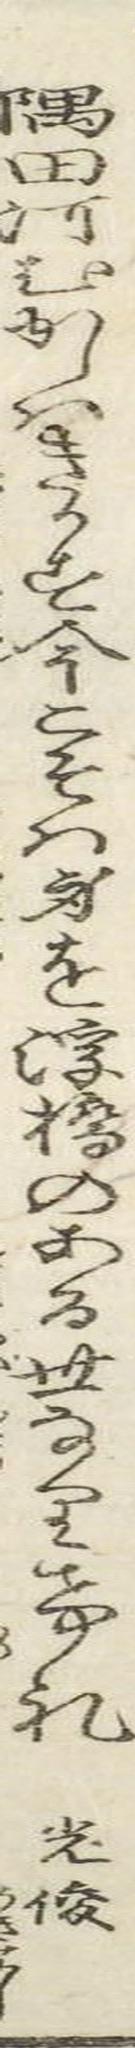隅田河むかしはきかす今こそは身を浮橋のある世なりけれ光俊
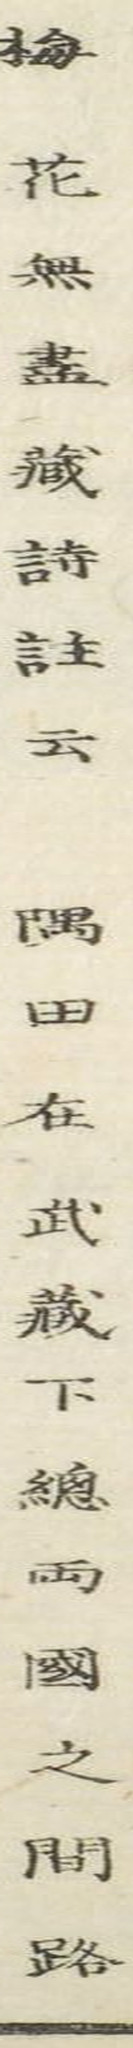梅花無盡蔵詩註云隅田在武蔵下総両国之間路
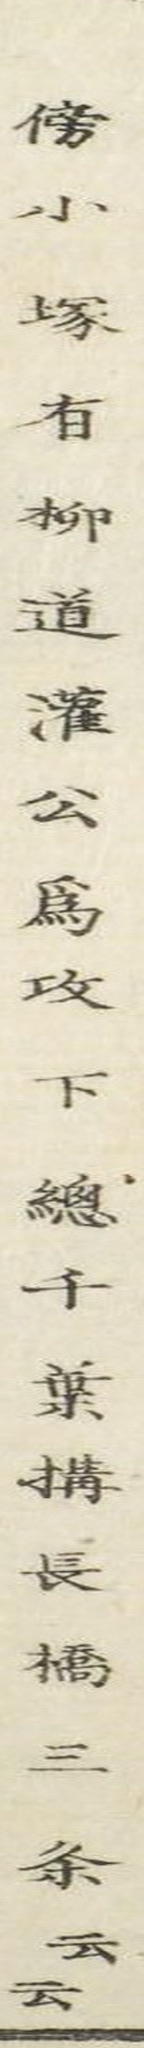傍小塚有柳道灌公為攻下総千葉構長橋三条云云
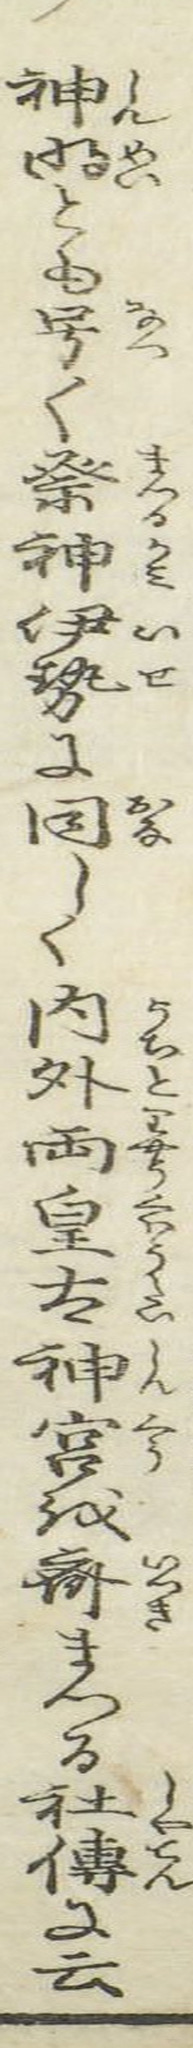神明とも号く祭神伊勢に同しく内外両皇太神宮を斎まつる社伝に云
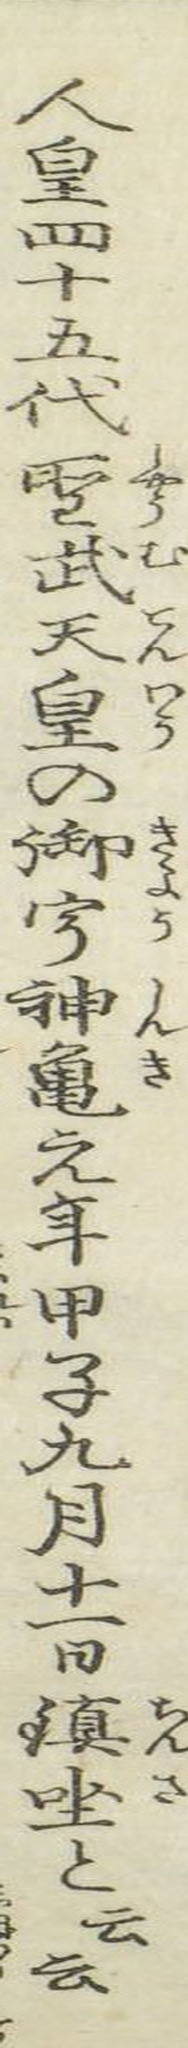人皇四十五代聖武天皇の御宇神亀元年甲子九月十一日鎮坐と云云

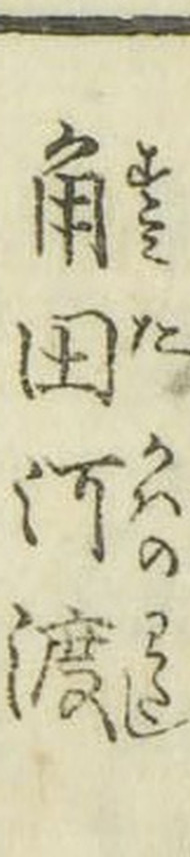角田河渡
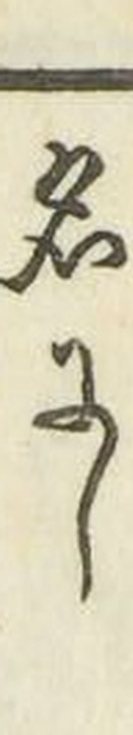名にし
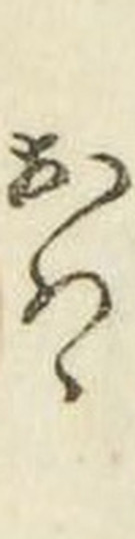おはゝ
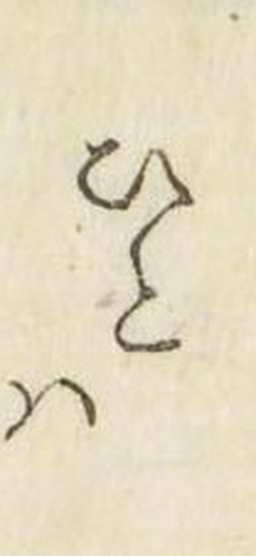ひとは
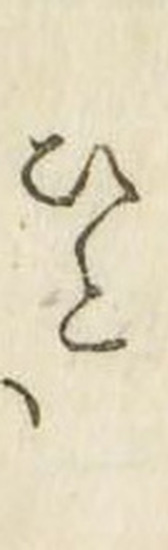ひとは
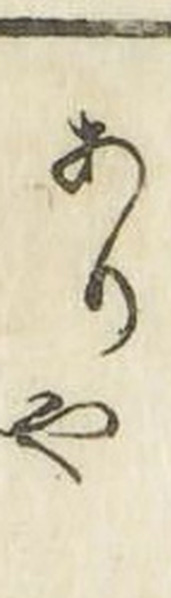ありや
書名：江戸名所図会 20巻 巻之17
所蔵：東京学芸大学教育コンテンツアーカイブ
